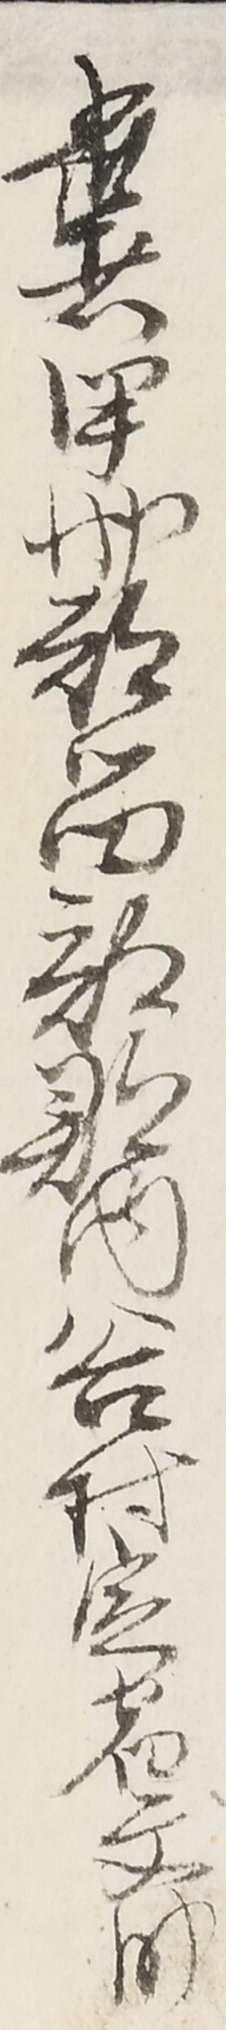此者甲州都留郡郡内谷村定宿文助
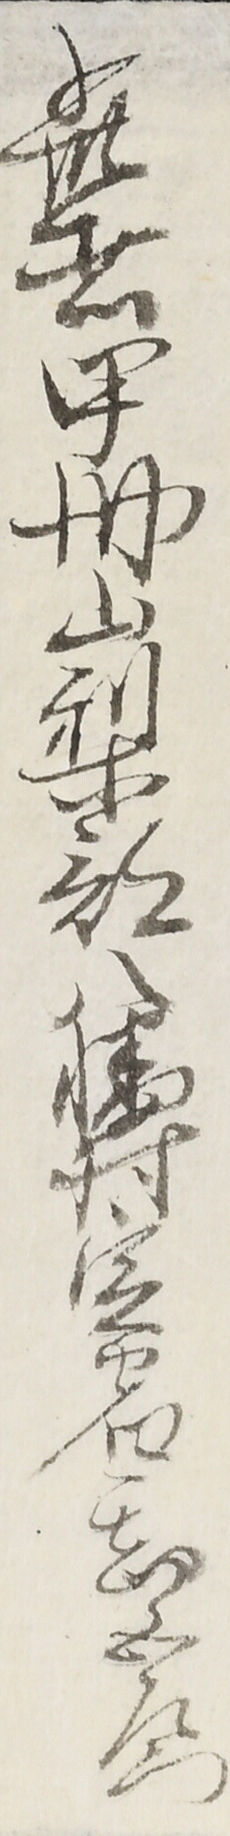此者甲州山梨郡八幡村定宿甚五左衛門

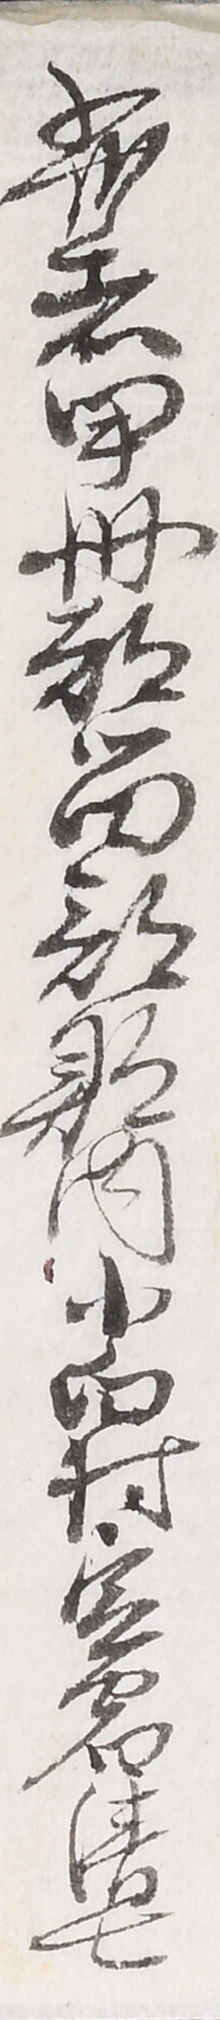此者甲州都留郡郡内小向村定宿清七
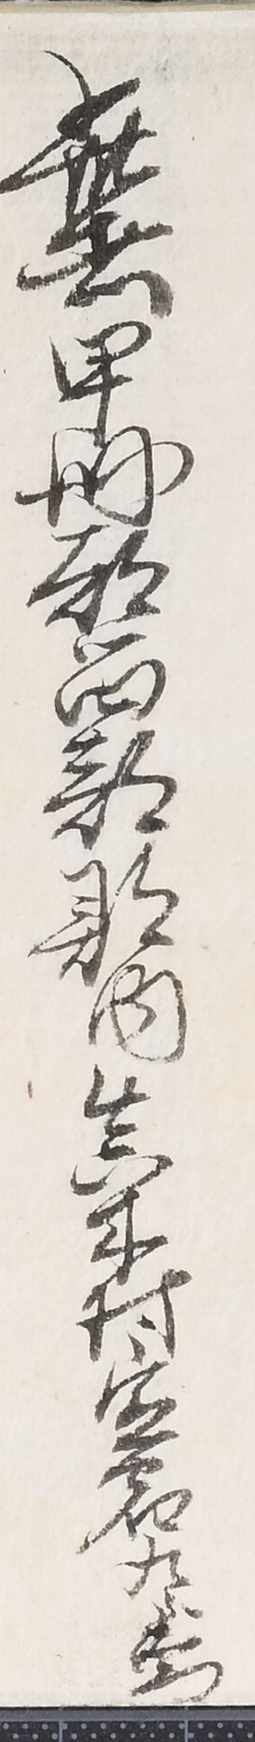此者甲州都留郡郡内真木村定宿九郎右衛門
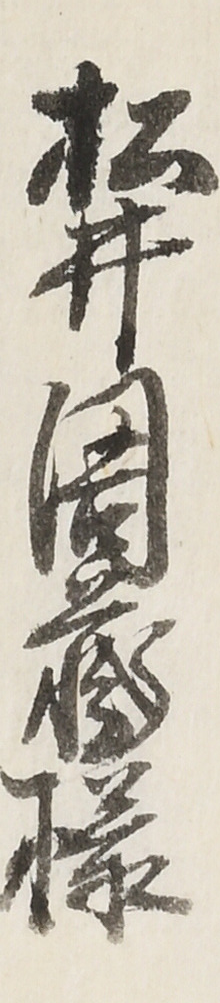松井周蔵様
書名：嘉永五壬子年二月他國出石切名前書上帳
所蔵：伊那市立高遠町図書館・合同会社AMANE
